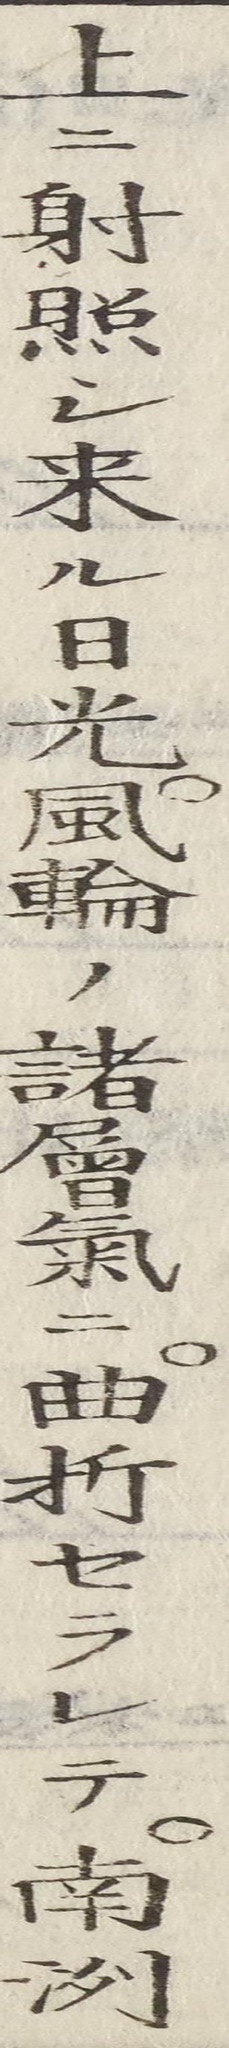上ニ射照シ来ル日光。風輪ノ諸層気ニ。曲折セラレテ。南洲
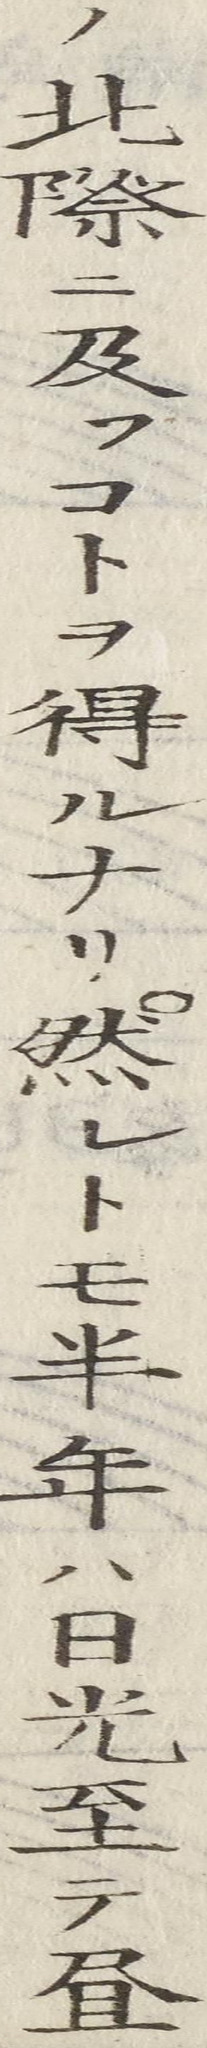ノ北際ニ及フコトヲ得ルナリ。然レトモ半年ハ日光至テ昼
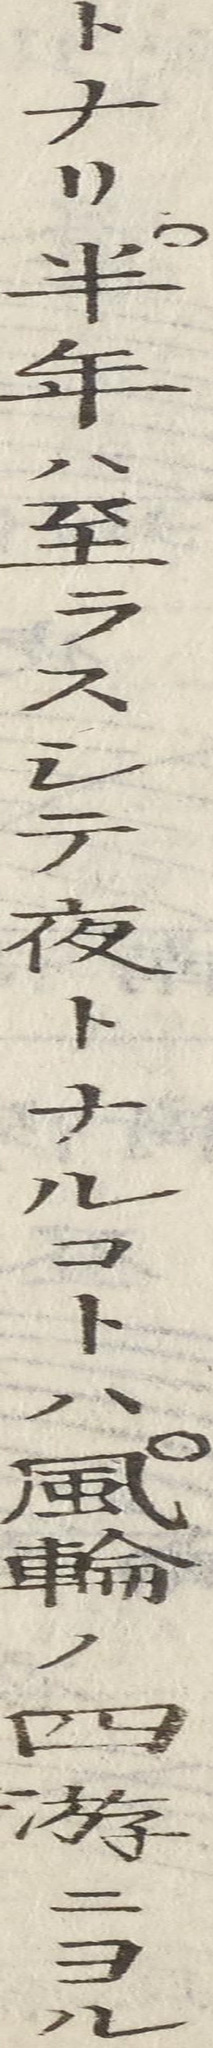トナリ。半年ハ至ラスシテ夜トナルコトハ。風輪ノ四游ニヨル
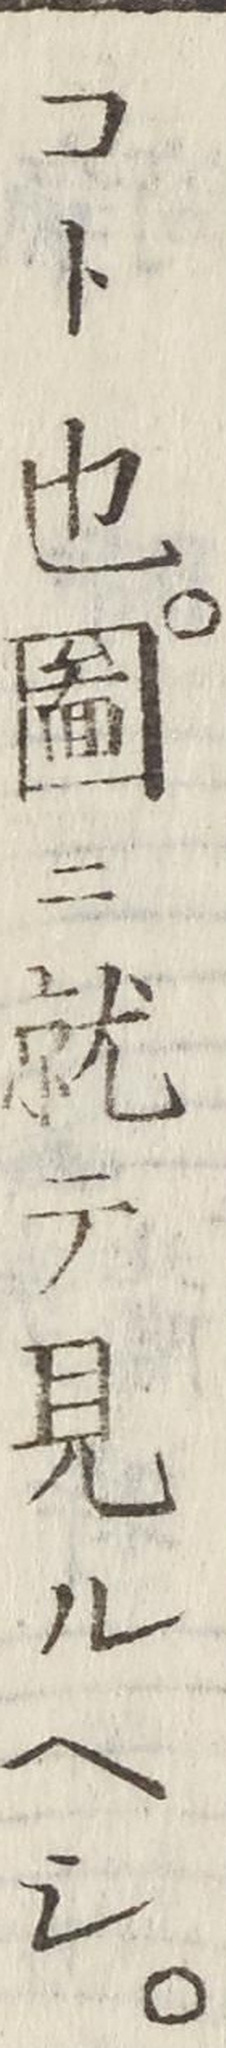コト也。図ニ就テ見ルヘシ。
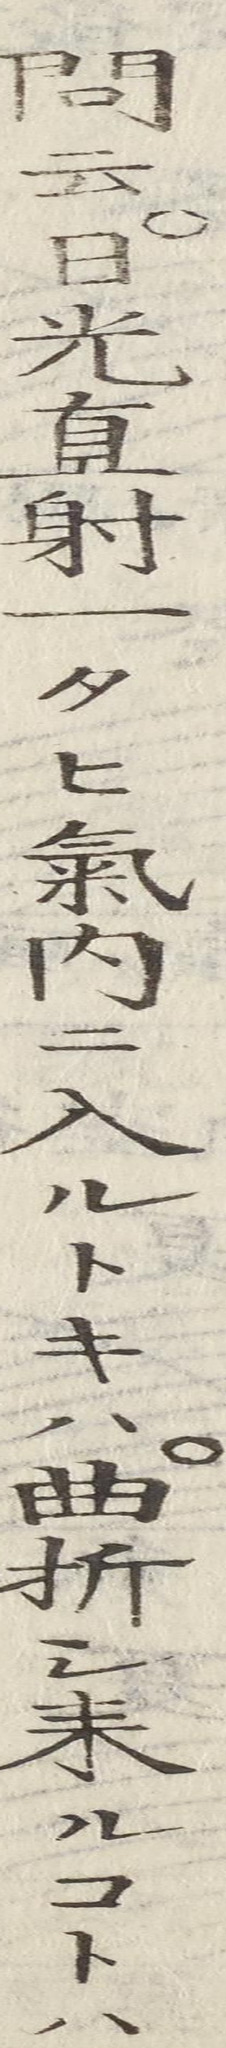問云。日光直射一タヒ気内ニ入ルトキハ。曲折シ来ルコトハ
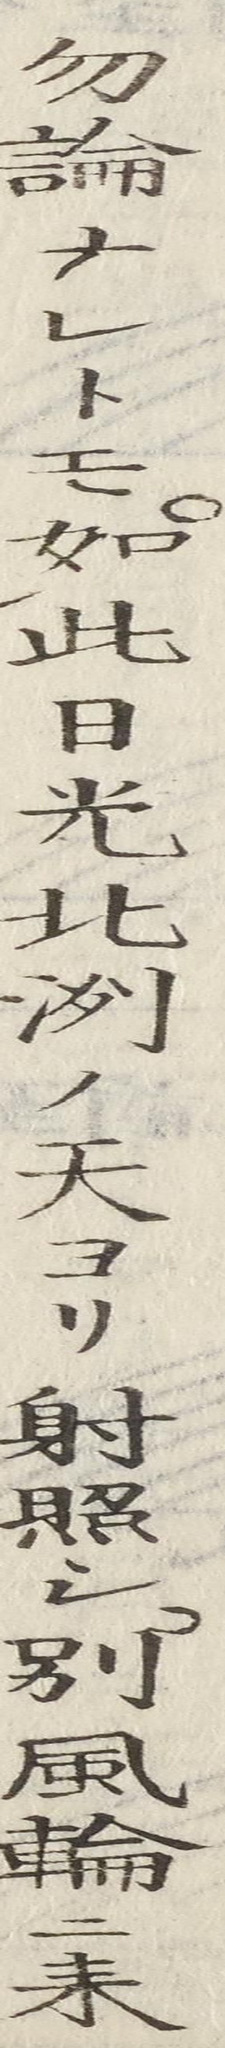勿論ナレトモ。如此日光北洲ノ天ヨリ射照シ。別風輪ニ来
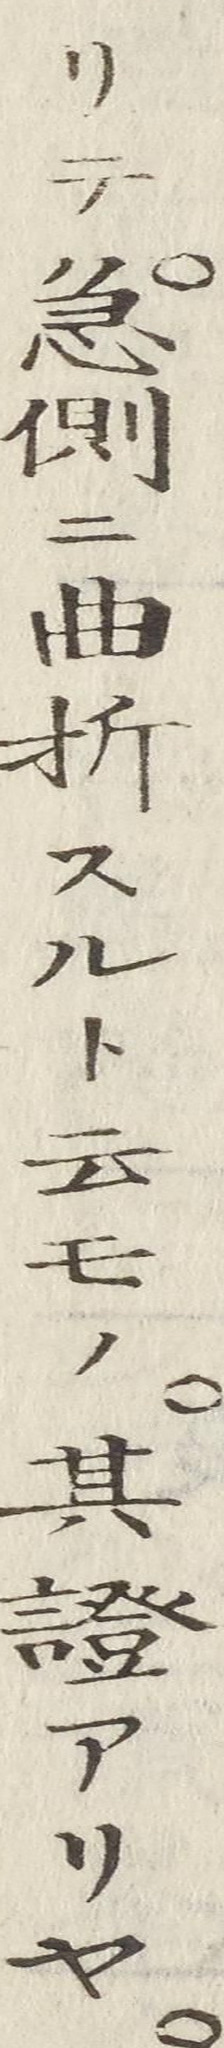リテ。急側ニ曲折スルト云モノ。其証アリヤ。
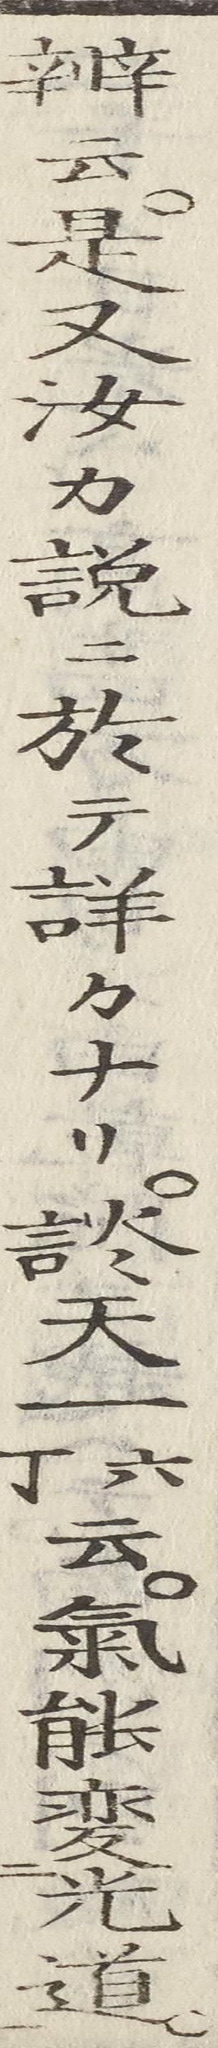弁云。是又汝カ説ニ於テ詳カナリ。談天一六丁云。気能変ニ光道。
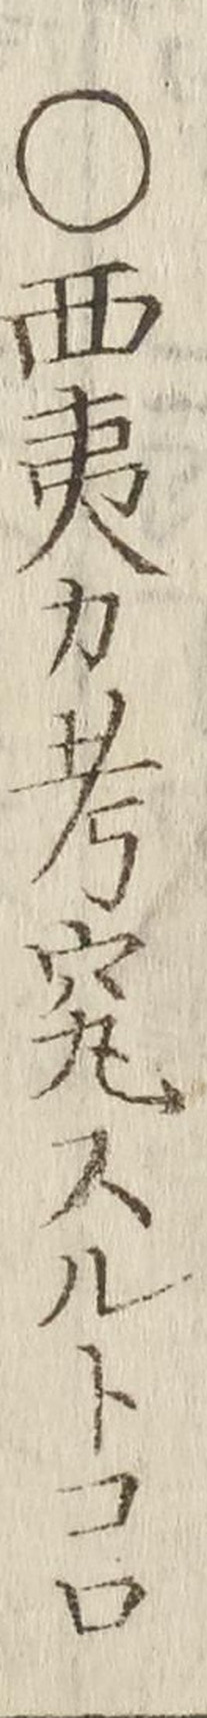〇西夷カ考究スルトコロ
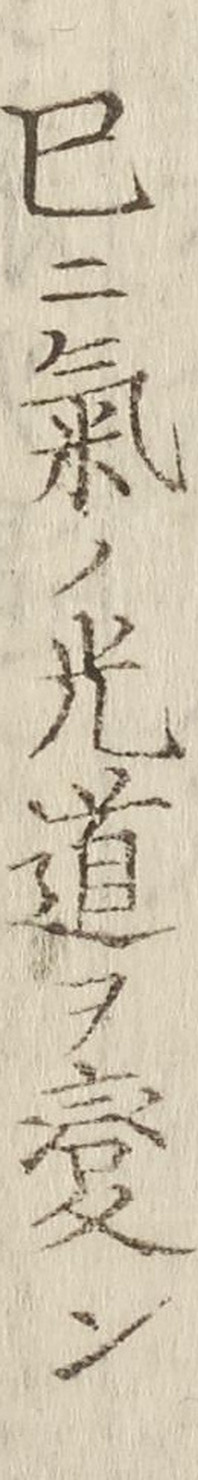已ニ気ノ光道ノ変ン
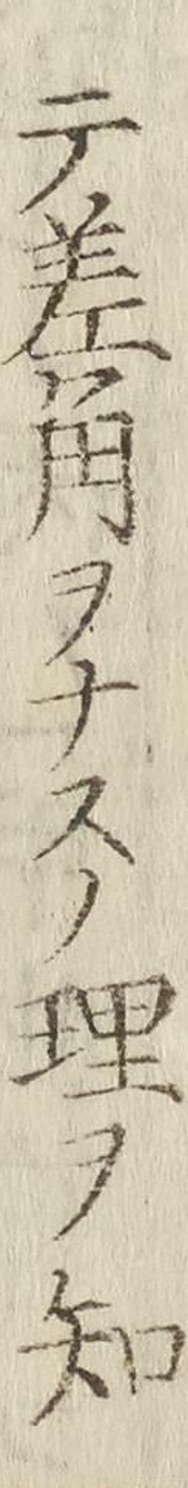テ差角ヲナスノ理ヲ知
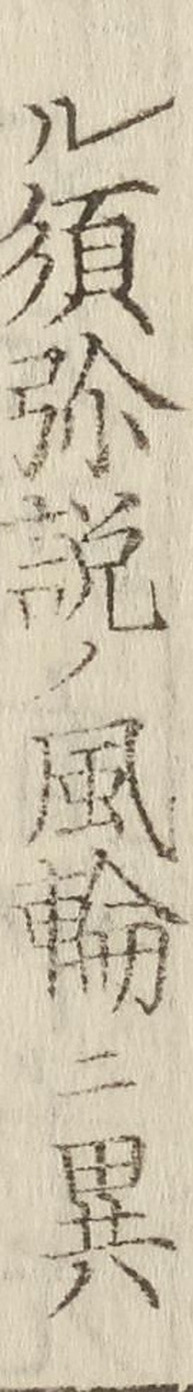ル須弥説ノ風輪ニ異
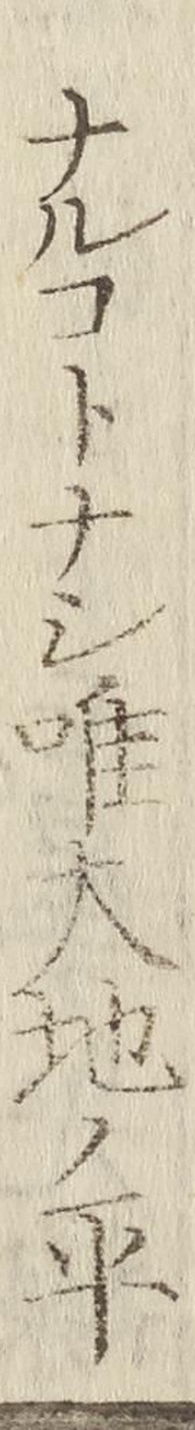ナルコトナシ唯大地ノ平
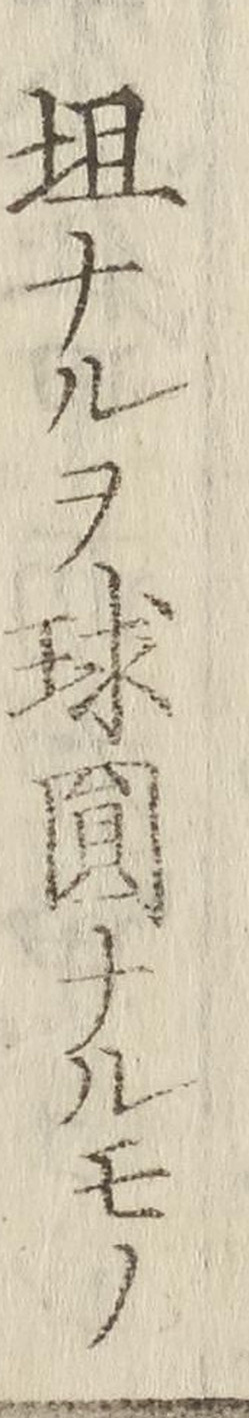坦ナルヲ球円ナルモノ
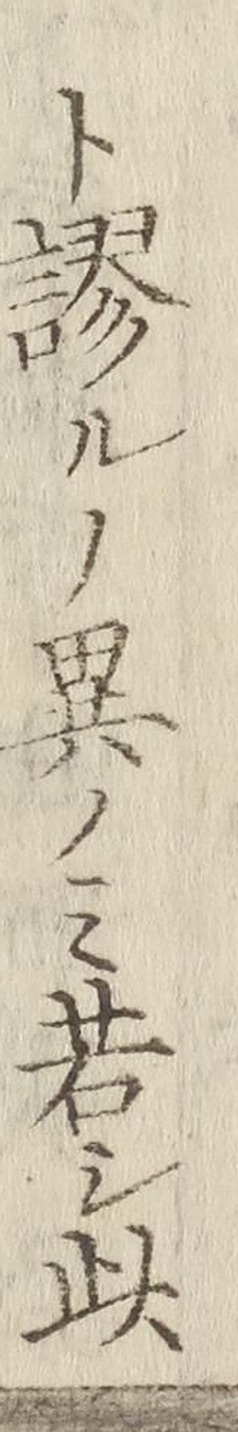ト謬ルノ異ノミ若シ此
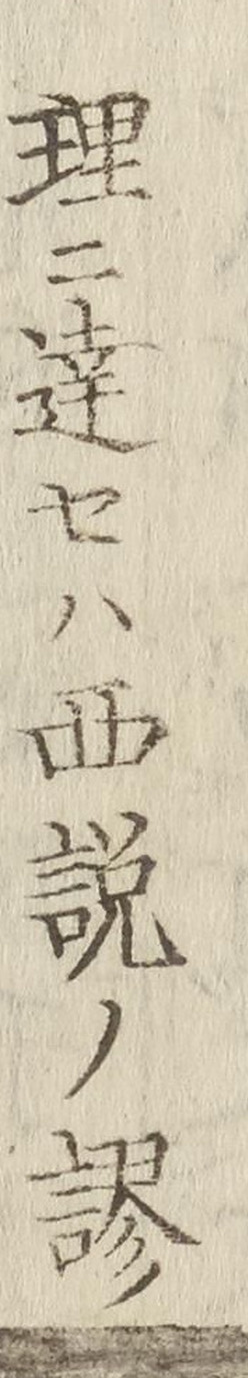理ニ達セハ西説ノ謬
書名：護法新論　二編　上
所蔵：東京大学地震研究所図書室 Earthquake Research Institute Library, The University of Tokyo, JAPAN
